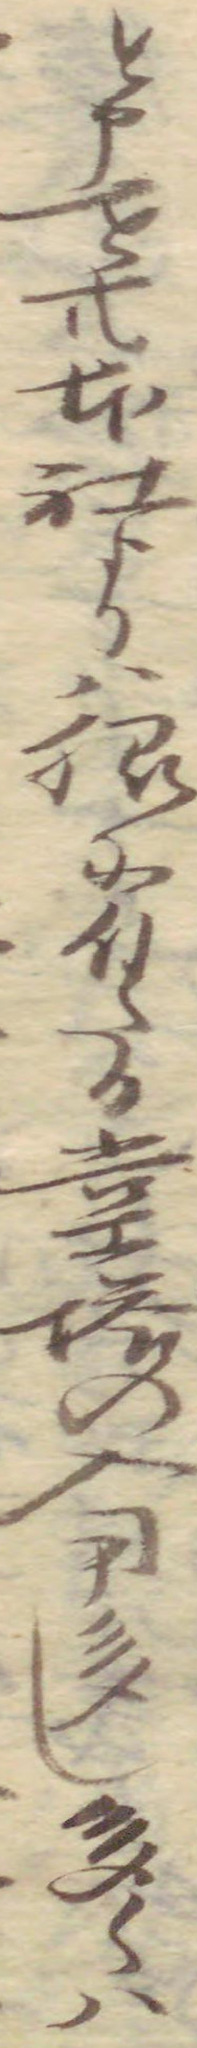と申せ共本社よりは脇に付たる堂塔の入用多し多くは
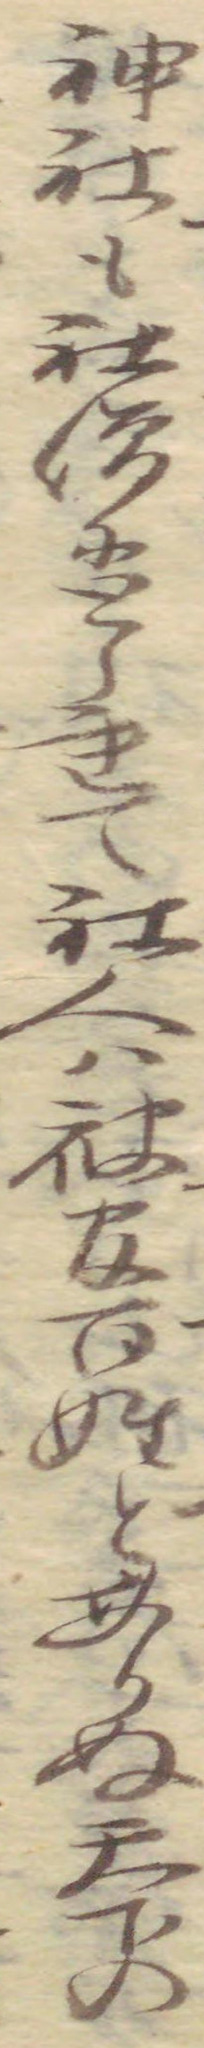神社も社僧にとられて社人は彼官百姓となりぬ天下の
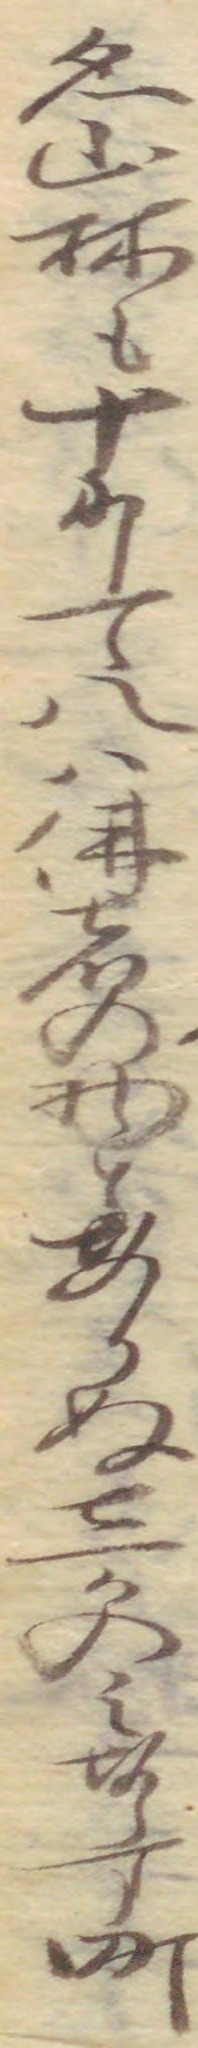名山林も十にして八は仏者の物となりぬしかのみならす町

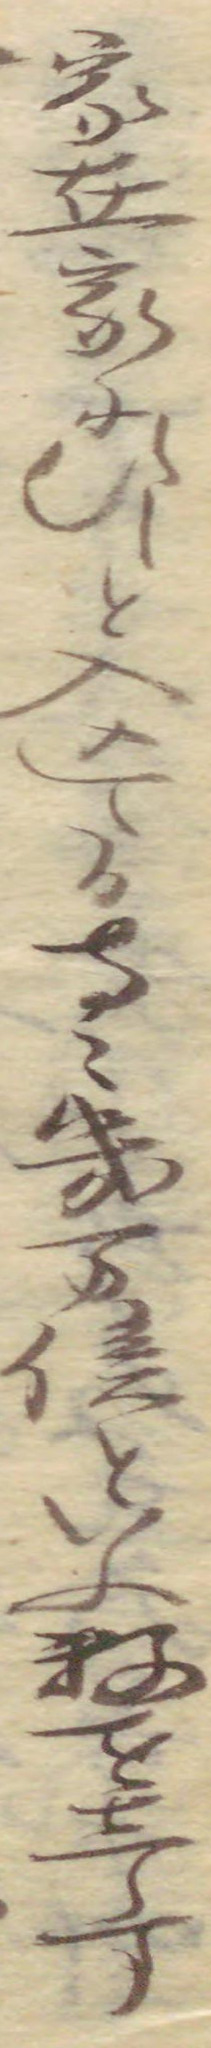家在家にひしと入込たる寺〻幾万億といふ数をしらす
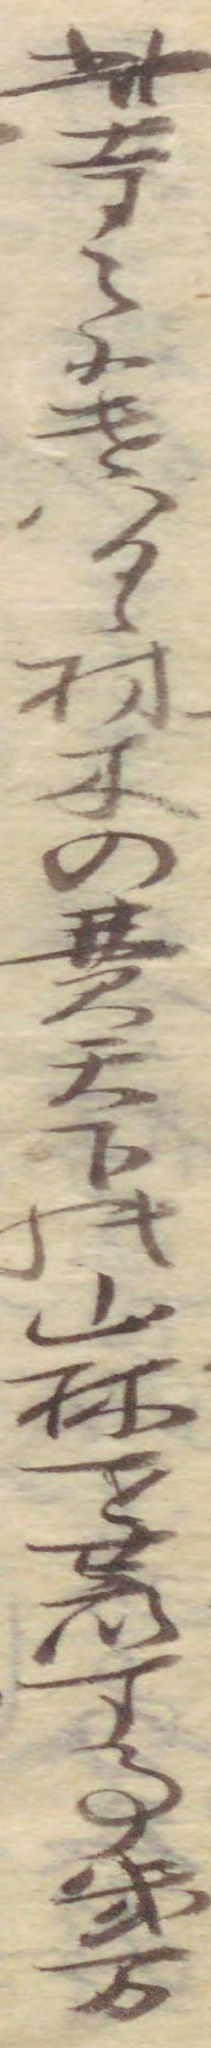此寺〻に遣はるゝ材木の費天下の山林を荒す事幾万
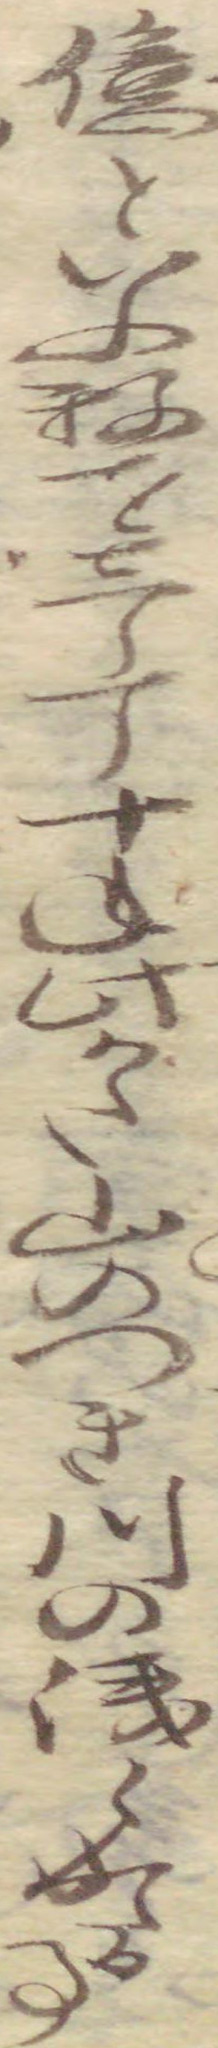億といふ数をしらす十年此かた山のつき川の浅く成たる事
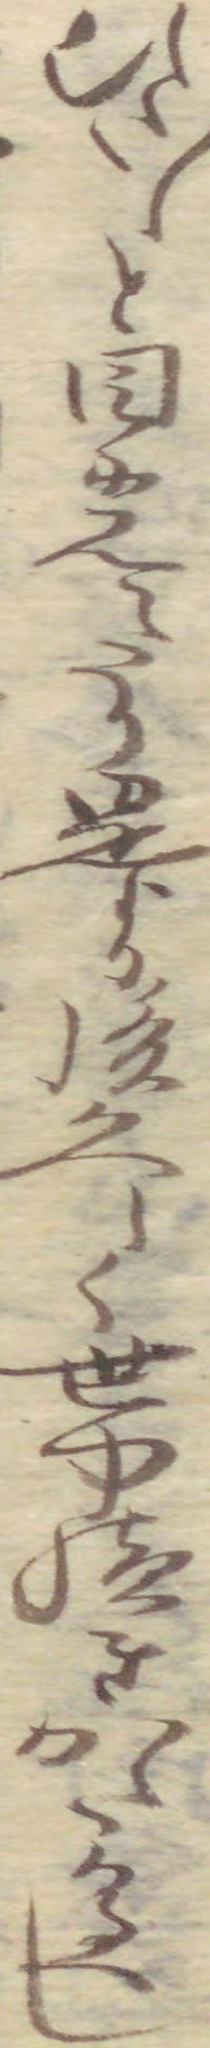ひた〳〵と目に見えたり是より後久しく世中続きかたかるへし
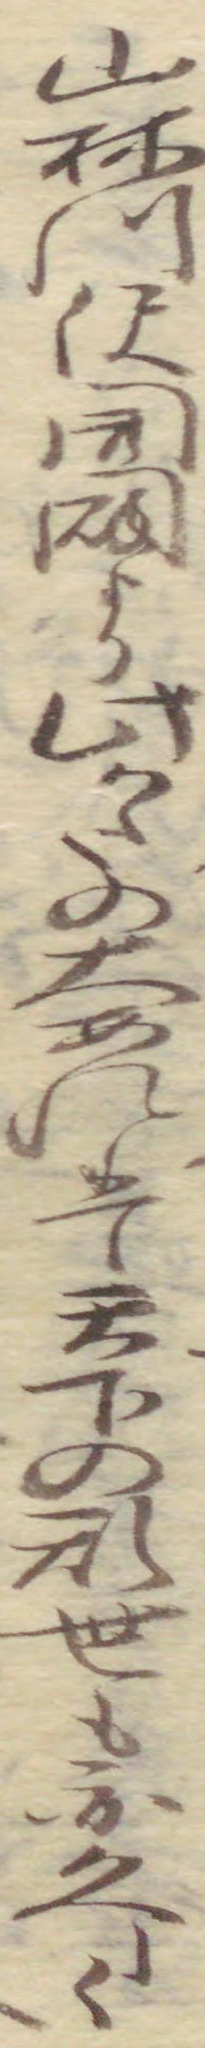山林川沢開闢より此かたの大あれにて天下の乱世も亦久しく
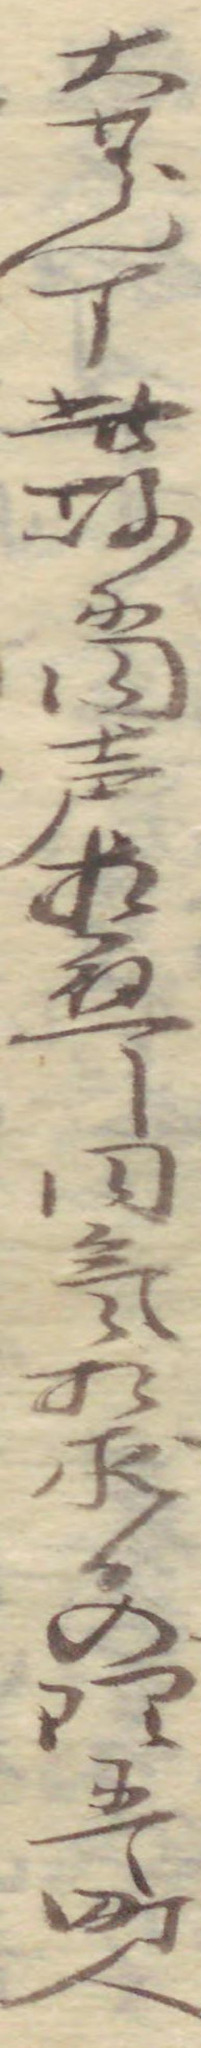大ならんす此故に同声相応し同気相求るの理にて町人
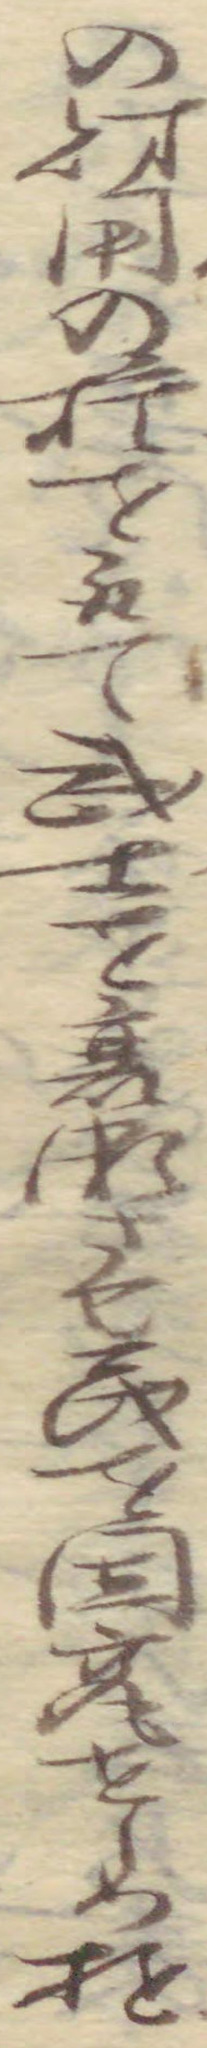の財用の権を取て武士を衰微させ民を困窮せしめ遊
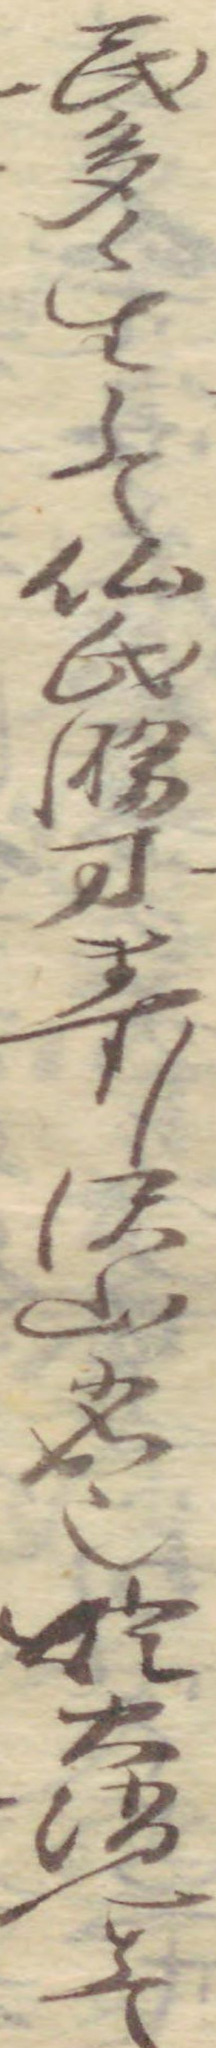民多く生して仏氏勝方ます〳〵沢山に成也燈火消んとて
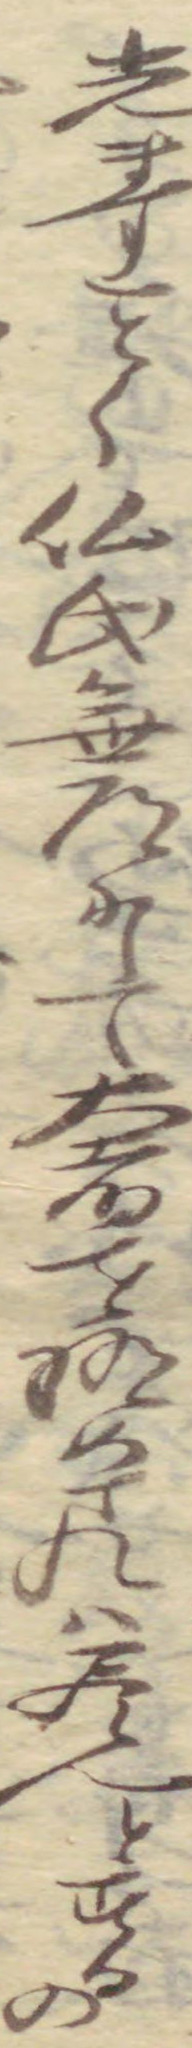光ますことく仏氏無道にして奢を極めされは尽んとするの
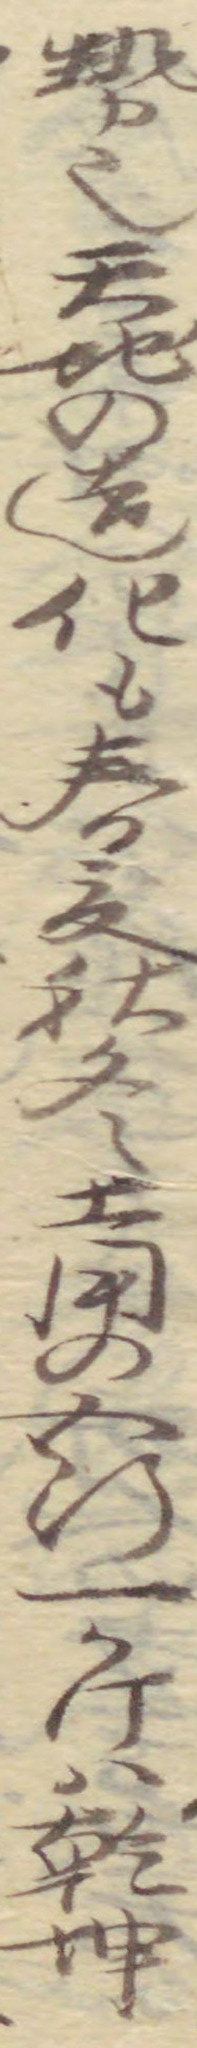勢也天地の造化も春夏秋冬土用の五行一かけは乾坤
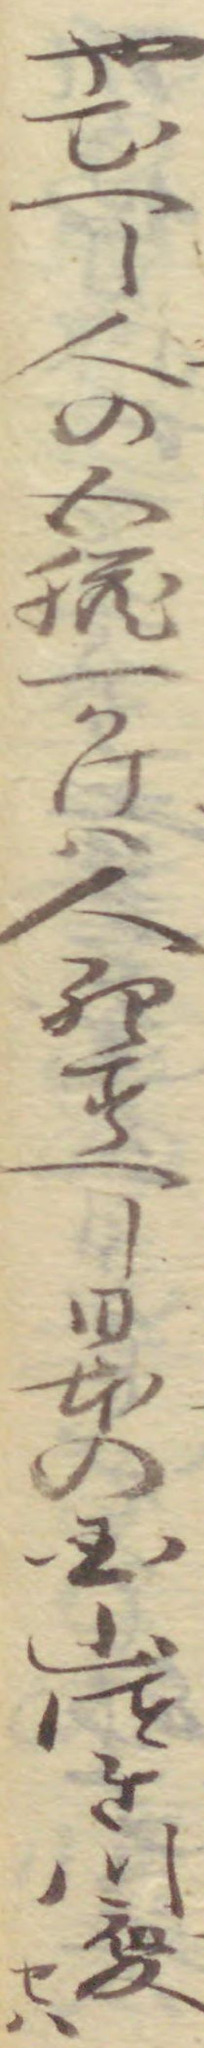やむへし人の五臓一かけは人死すへし日本の国山つき川変せは
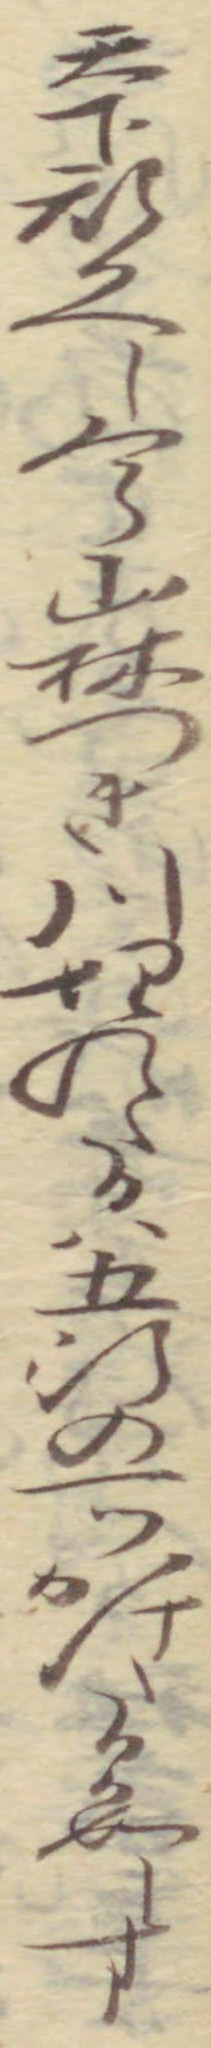天下乱るへし今山林つき川埋れたるは五行の一ツかけたるか如しす
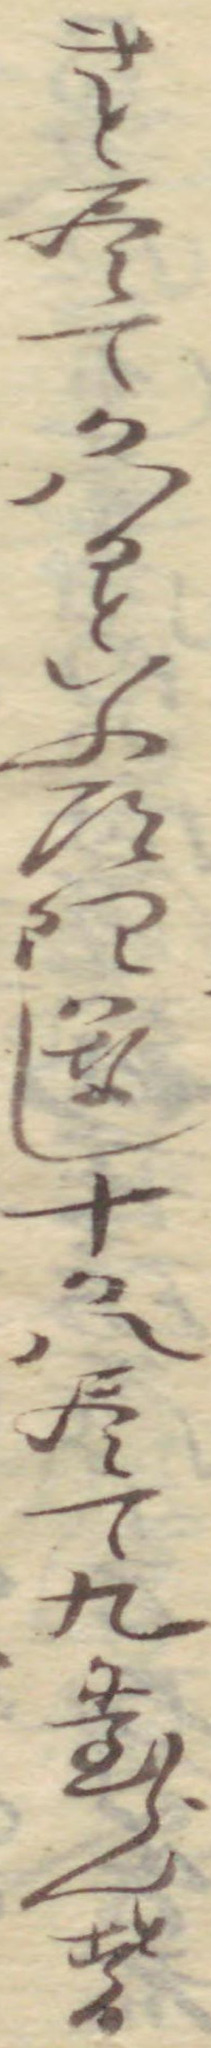きと尽てかはるといふ道理はなし十か八尽て九に至らんとする
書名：鶯宿雑記. 巻263-264
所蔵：国立国会図書館 National Diet Library, JAPAN
